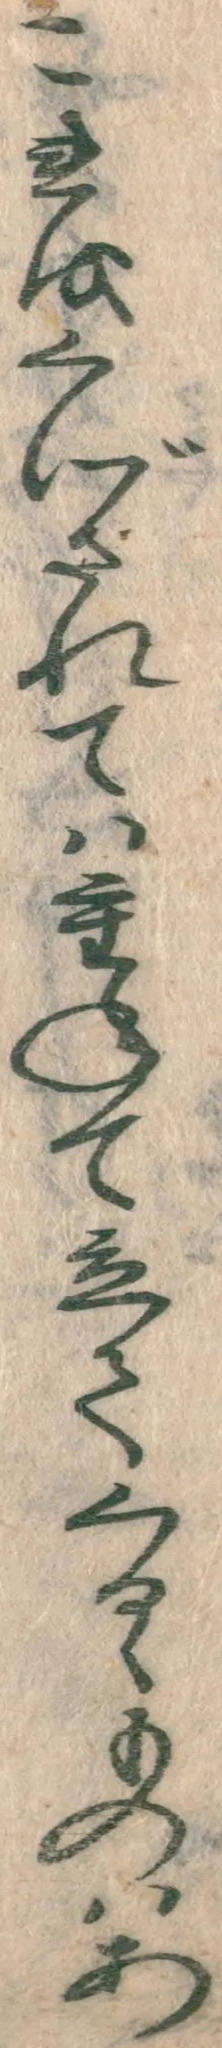これをくづされては重ねて立てくるゝものはあ
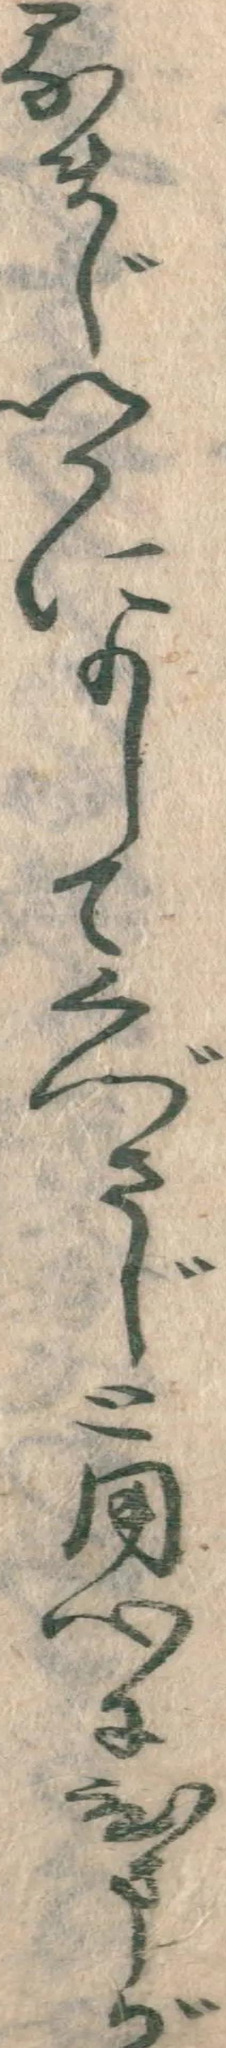るまじいかにもしてくづさじと用心にひましが
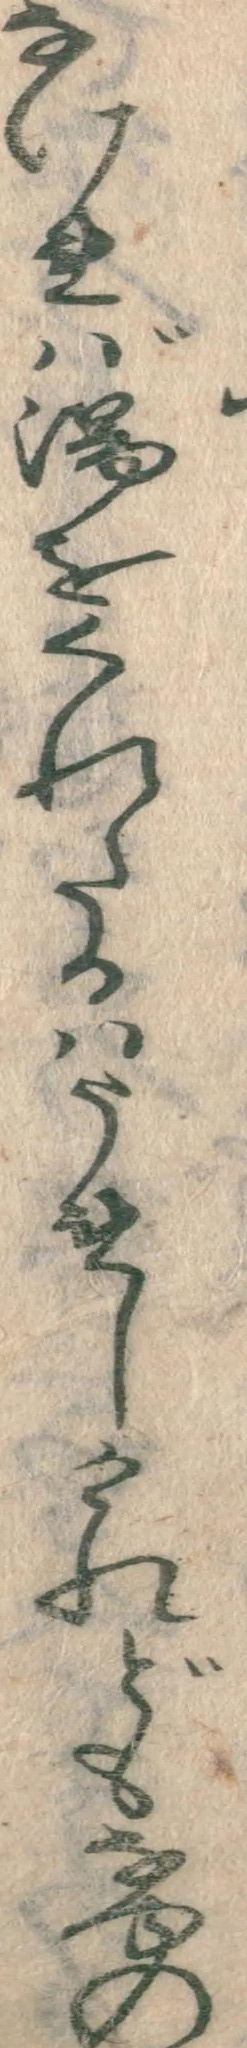なければ湯をくれたるはうれしけれどもをなゆの
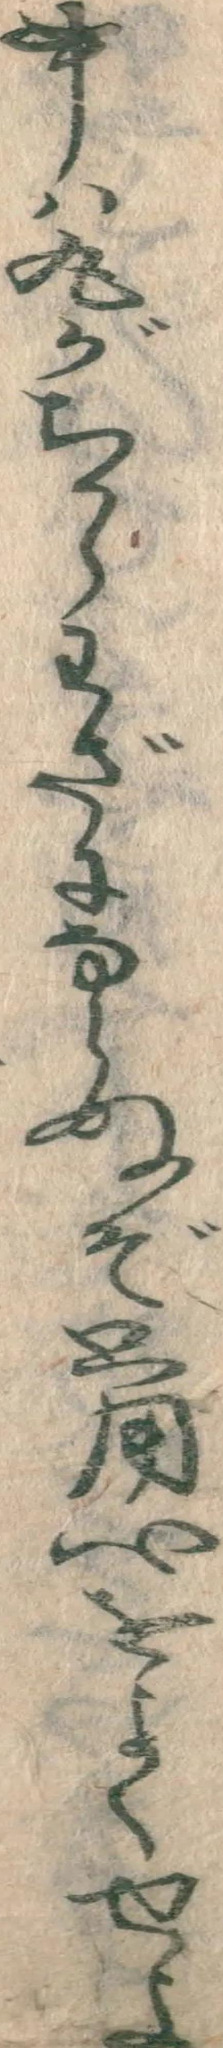事は丸がちからわざにならぬぞ只用心をよくせよ
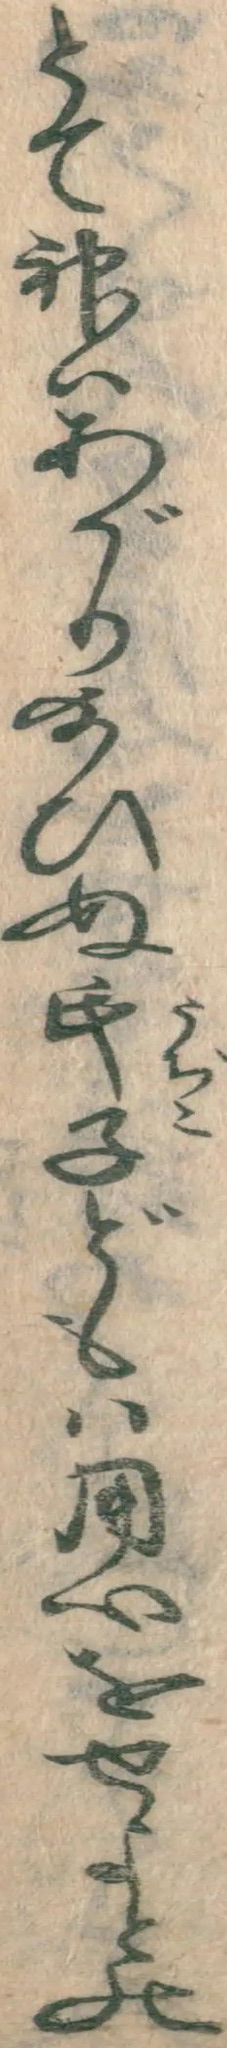とて神はあがり給ひぬ氏子どもは用心をせよとの

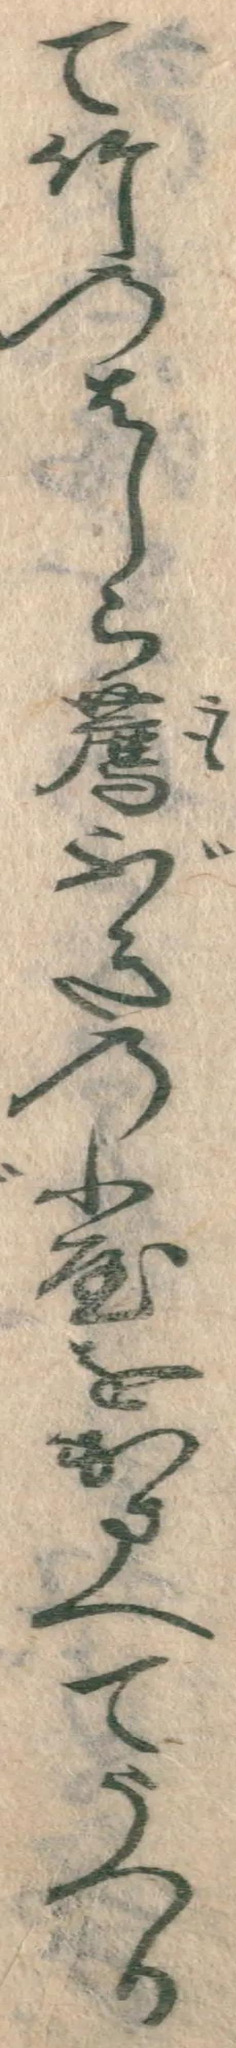て竹のはしら薦ぶきの小屋をかまへてうつり
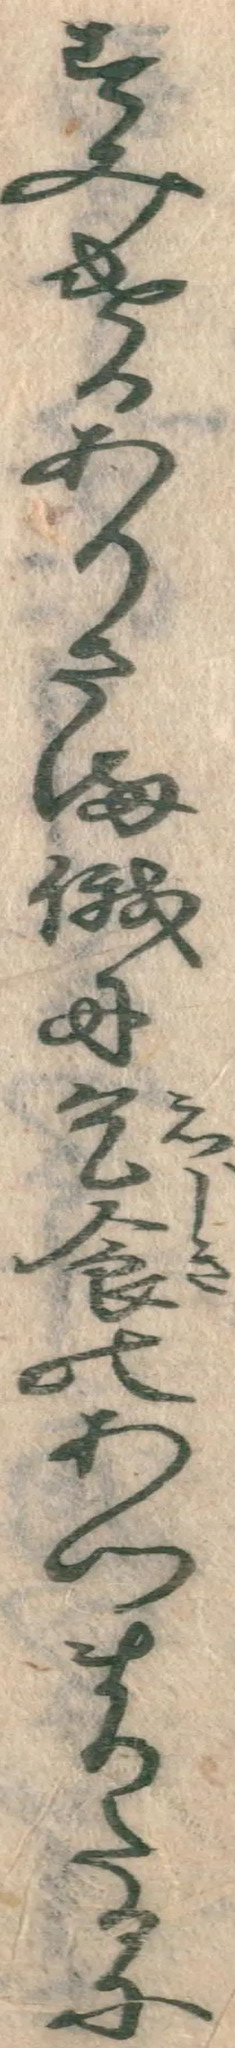すみけるありさま俄に乞食のあつまりたるに
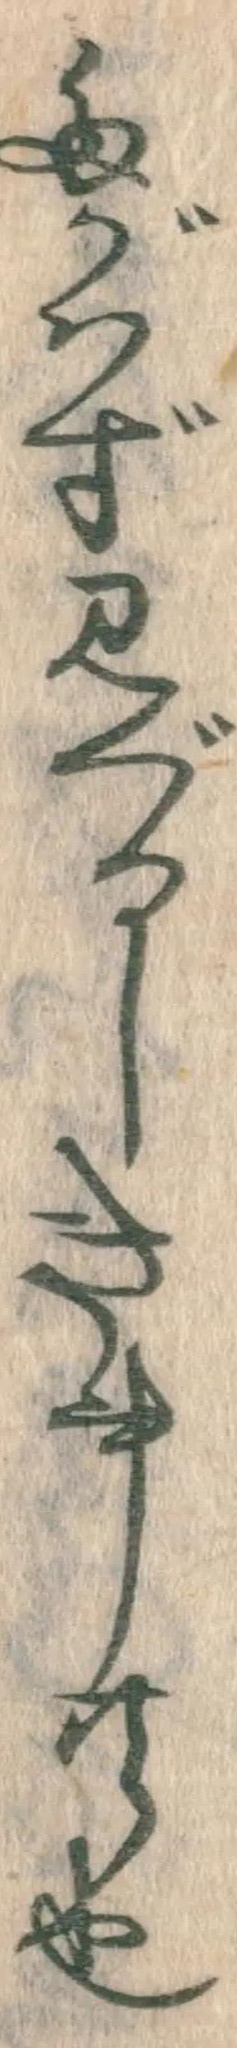たがはず見ぐるしき事共也
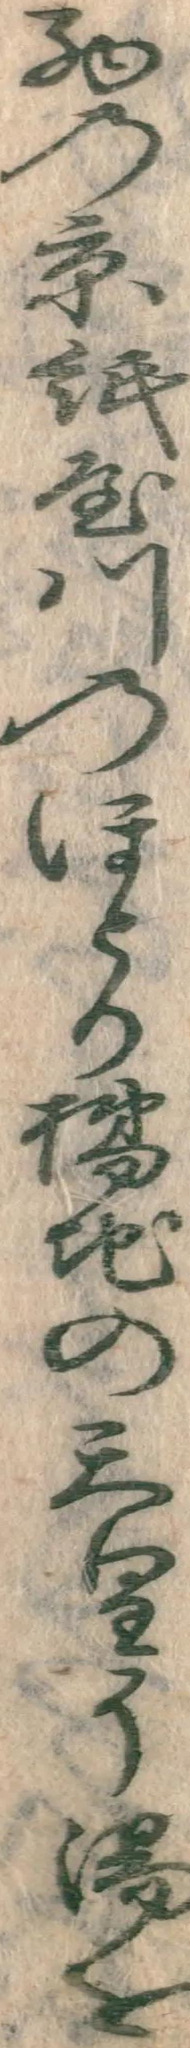西ノ京紙屋川のほとり橘地の天皇に湯を
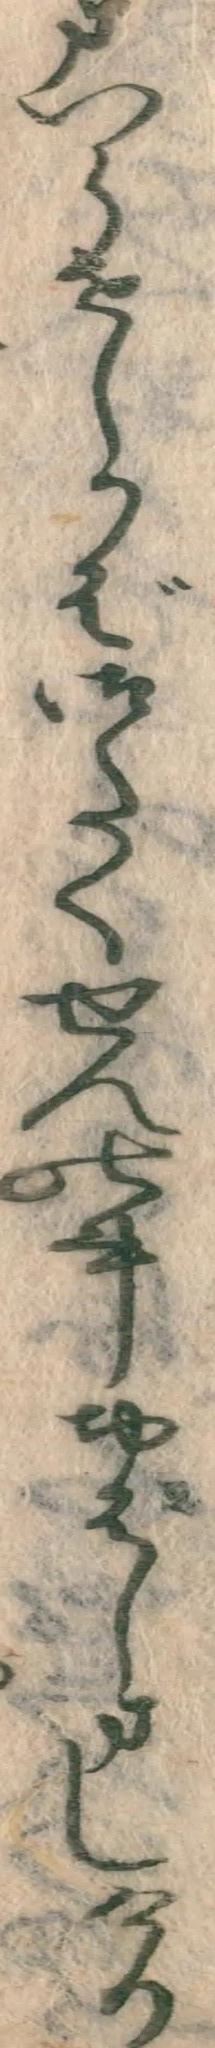まいらせしかば御たくせんの事おはしましけり
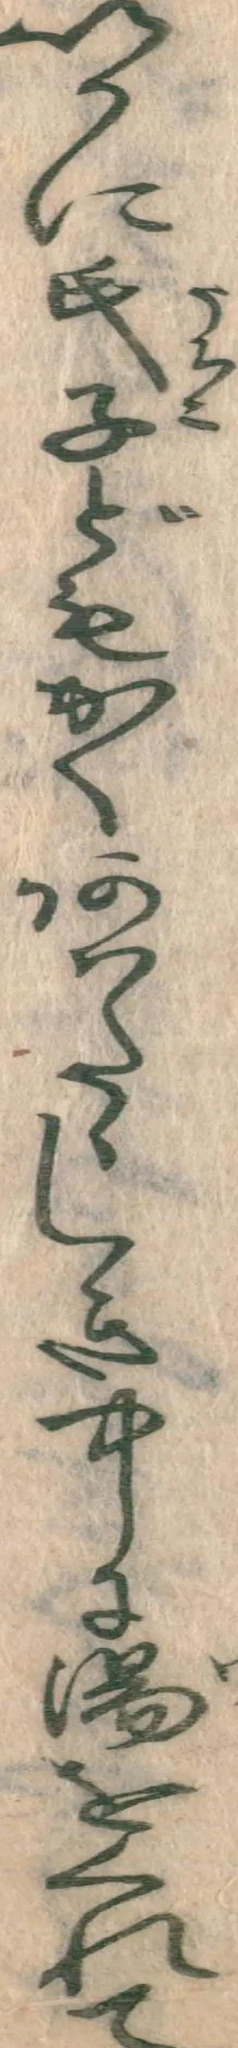いかに氏子どもかくあはたゝしき中に湯をくれて
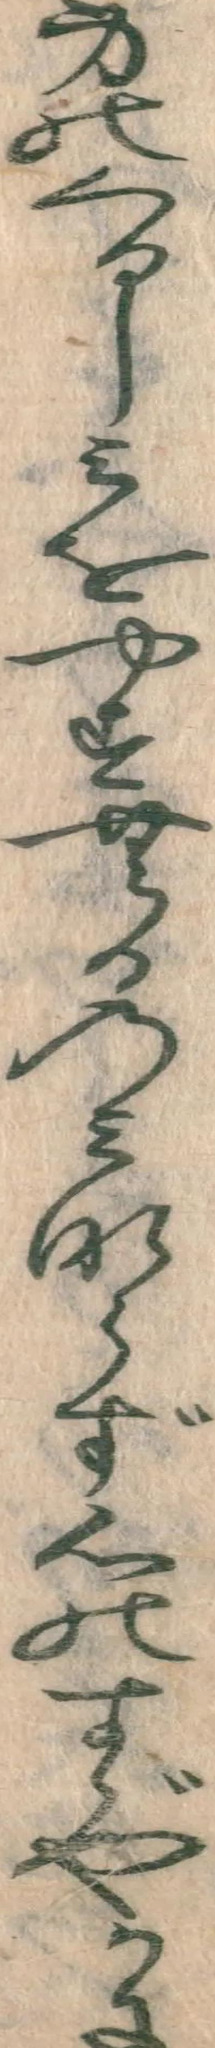身のくるしみをやすむるのみならず心のすゞやかに
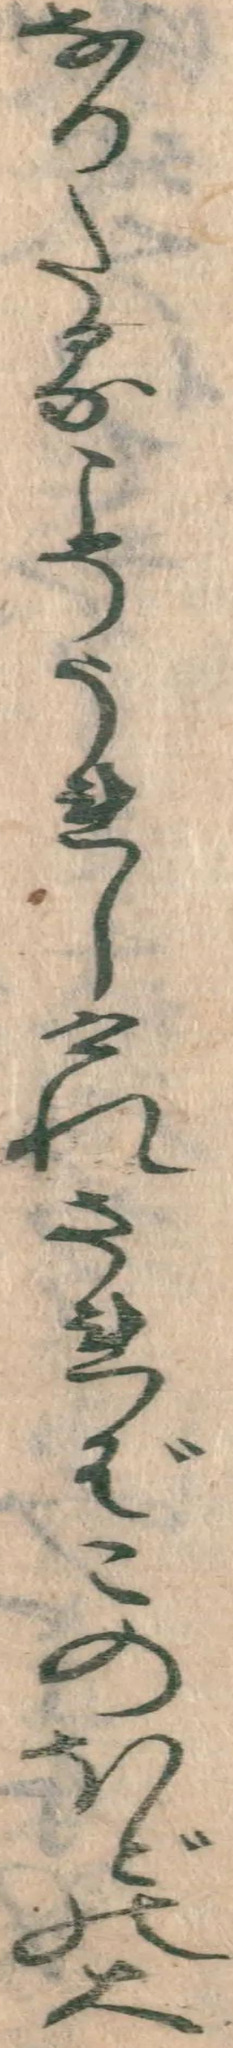なりたるこそうれしけれさればこのほどの大
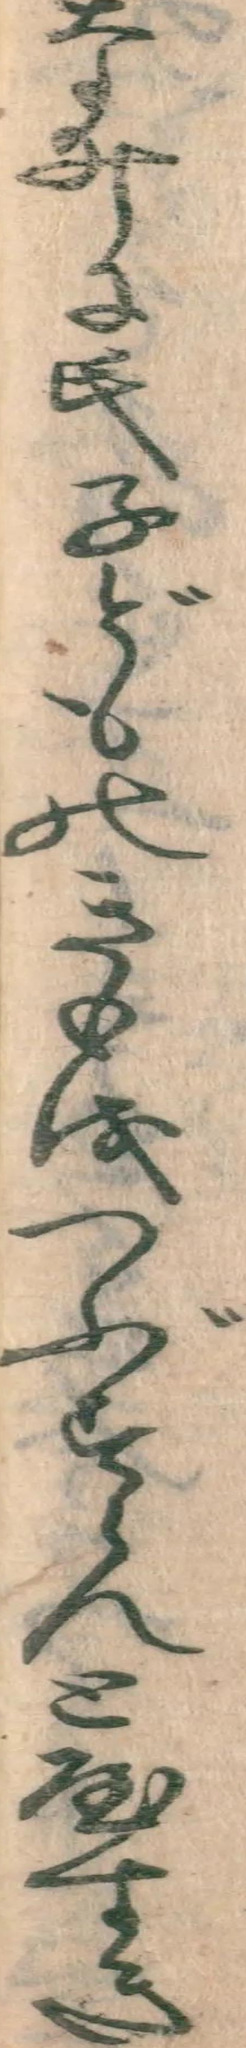なゐに氏子どものきもをつぶすらんとやすき
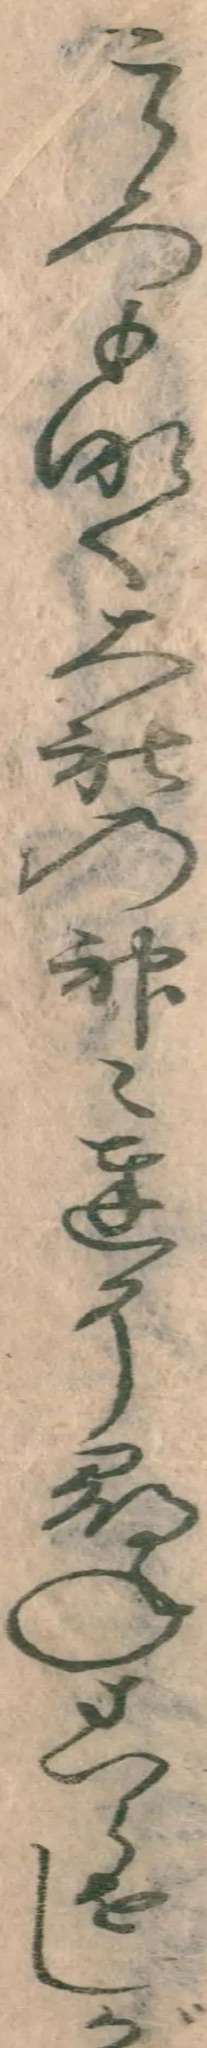こゝろもなく大社の神々達に尋ねまいらせしが
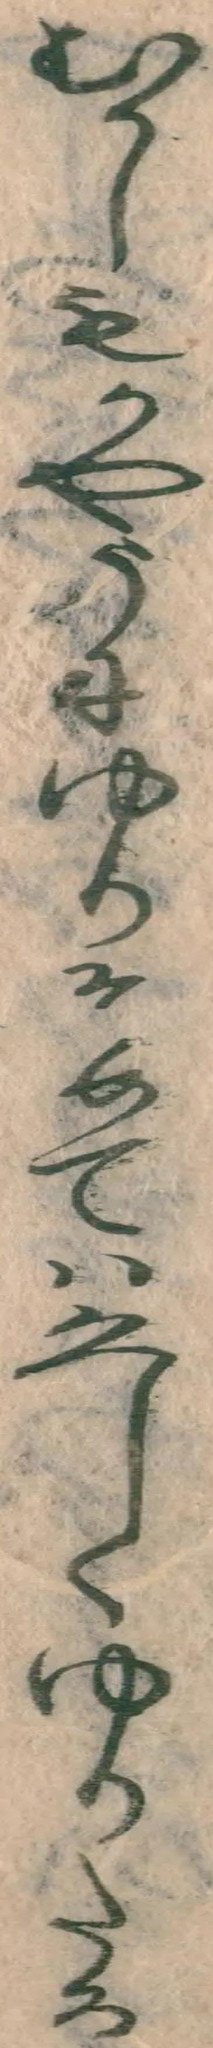むかしもかやうにゆりそめては久しくゆりたる
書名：艱難目異志. 上,下
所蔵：国立国会図書館 National Diet Library, JAPAN
